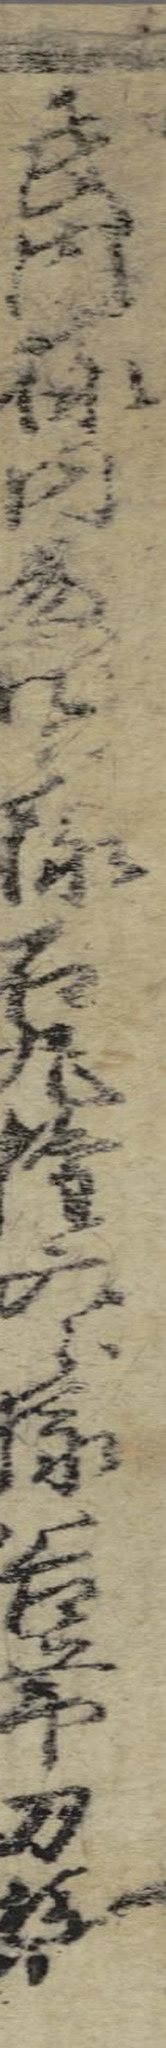武内様内藤四郎様石丸権六郎様谷帯刀様
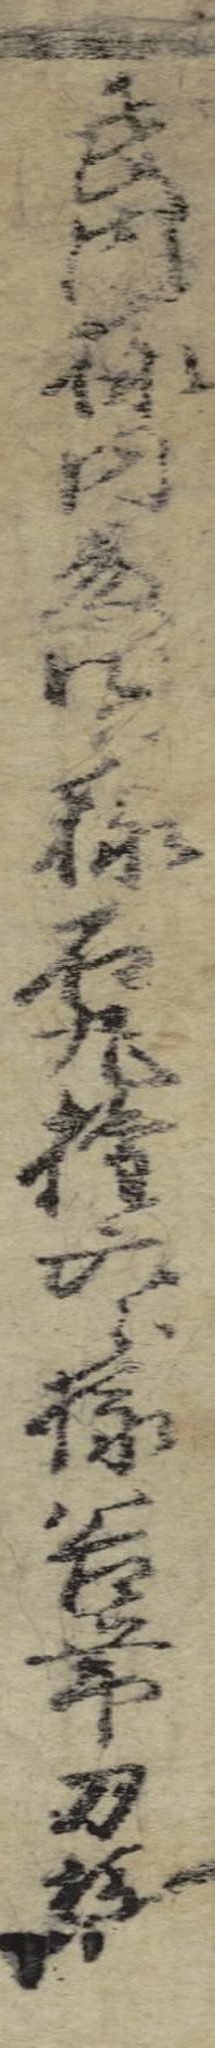武内様内藤四郎様石丸権六郎様谷帯刀様
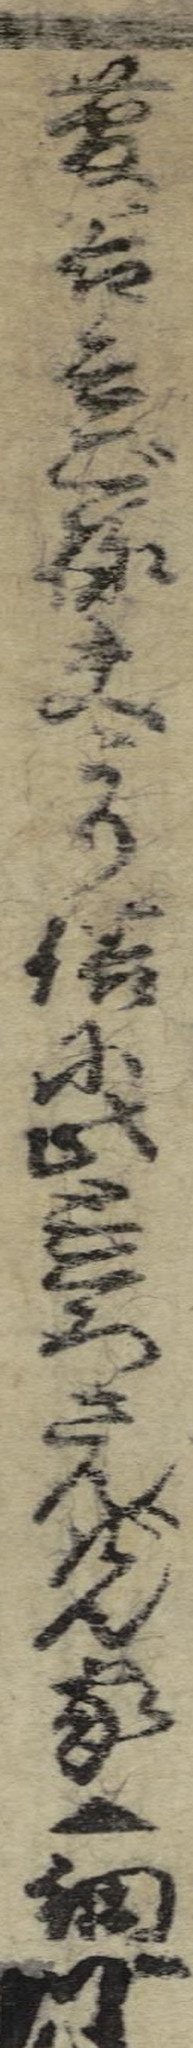菅谷兵ご様夫より俗に此ところさんげん家▲細川
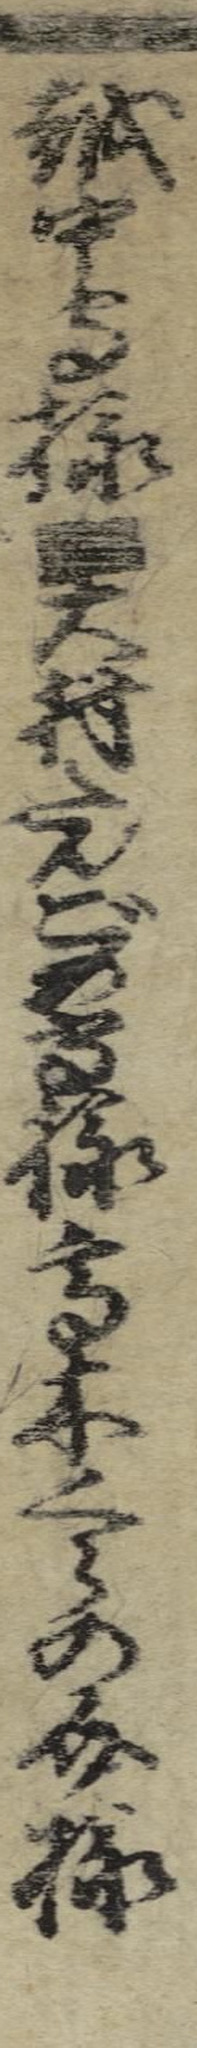越中守様大村たんごの守様高木くらの介様
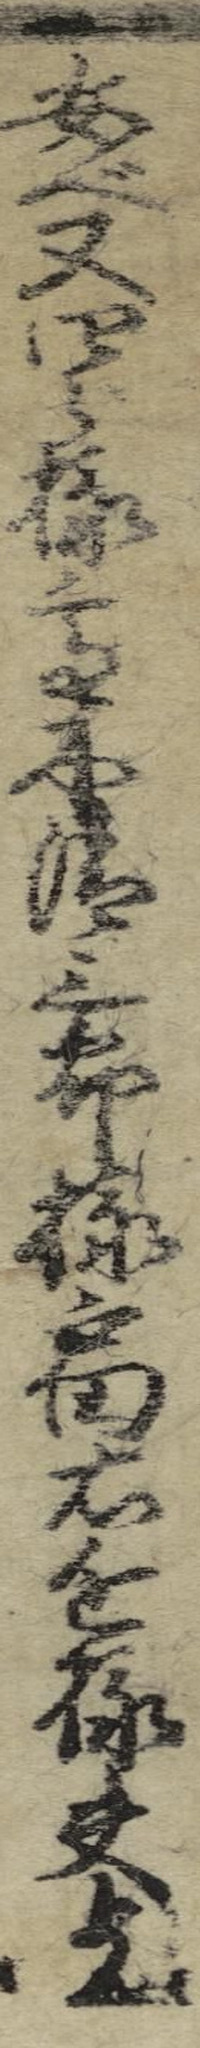安べ又四郎高木清三郎様戸田右近様夫より
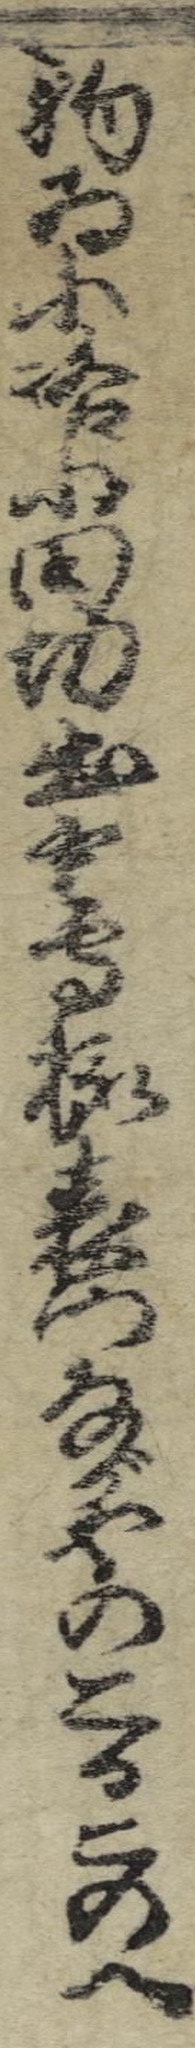駒ゐ小路小田切出雲守様表御門ながやのこるこのへ
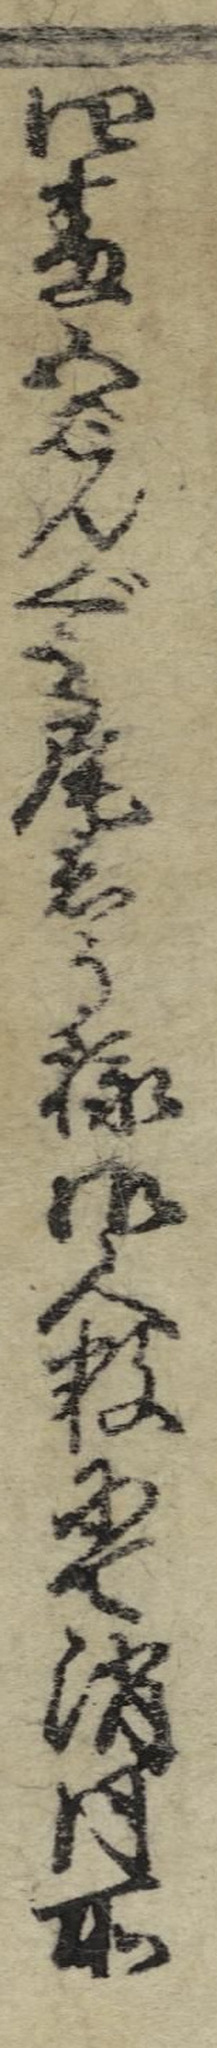四番五ばんぐら尾しう様御人数にて消同所
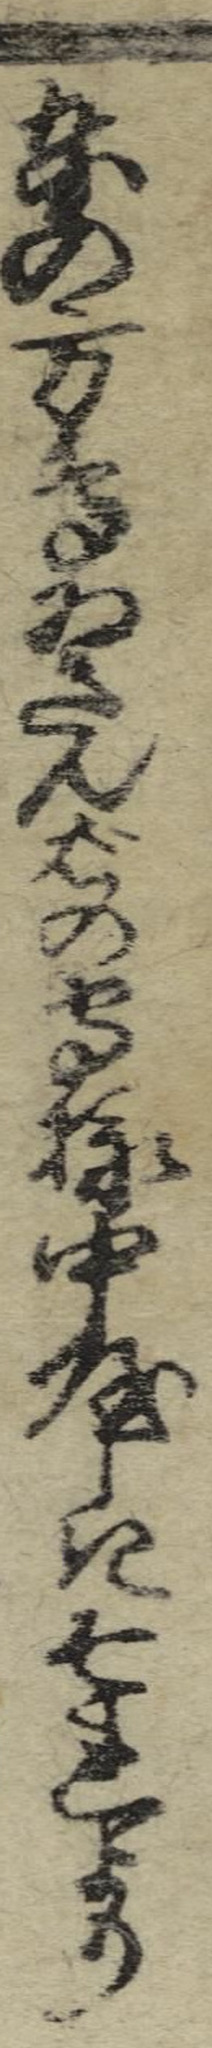東の方鳥居たんばの守様中屋しきそれより
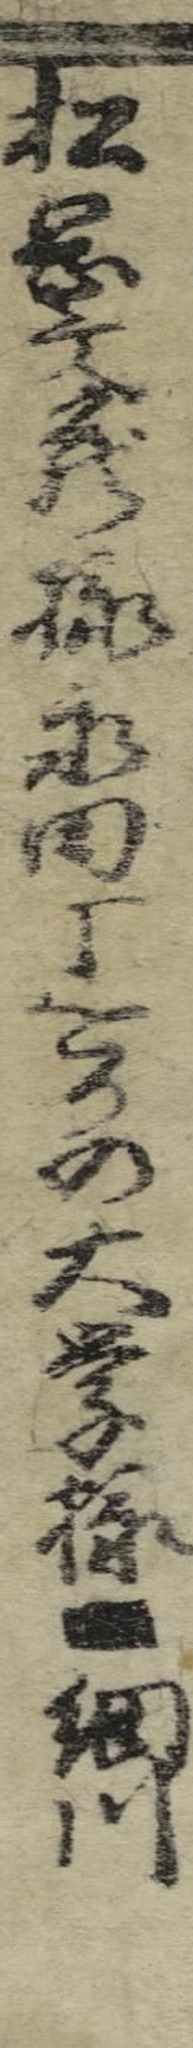松岡文蔵様永田丁をかの大学様細川
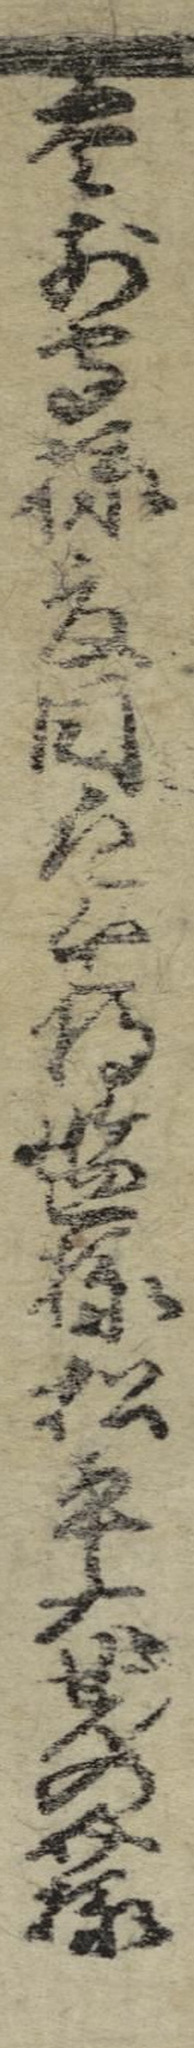豊前守様夏目左近将監様松平大ぜんの介様
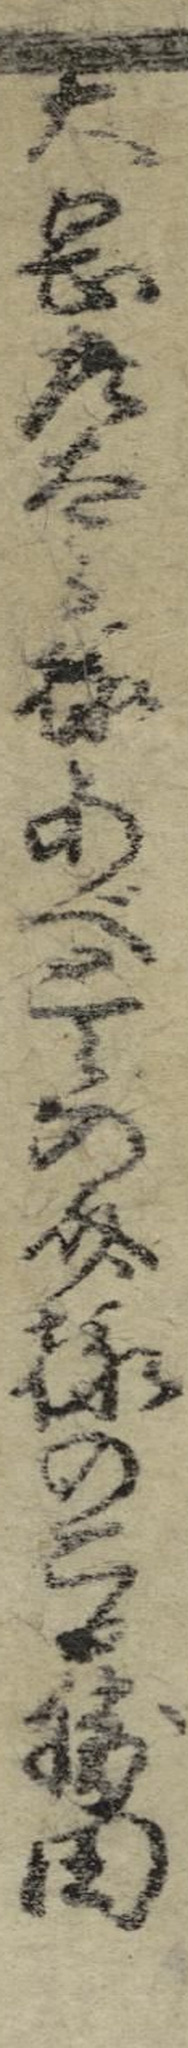大岡佐太郎様あべとみの介様のこる勝田
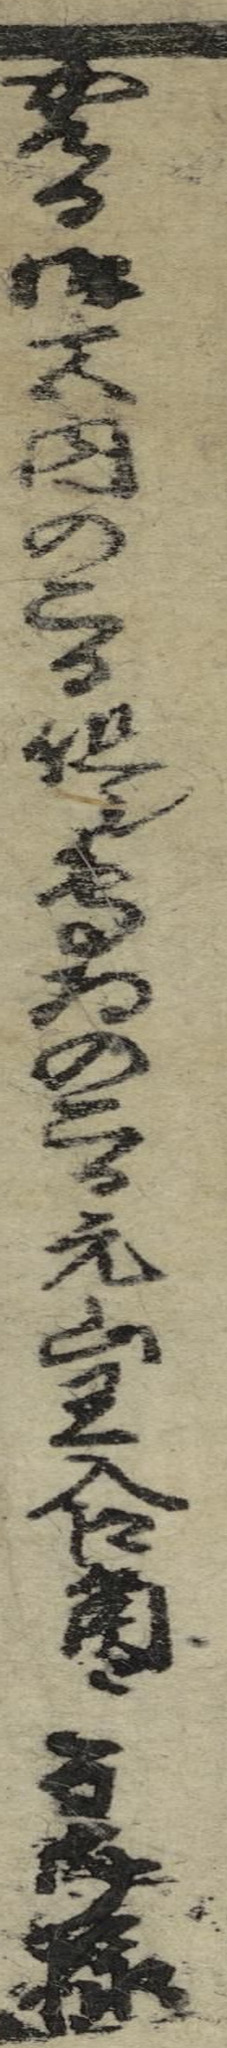やける御宮内のこる但シ鳥ゐのこる元山王入口角様
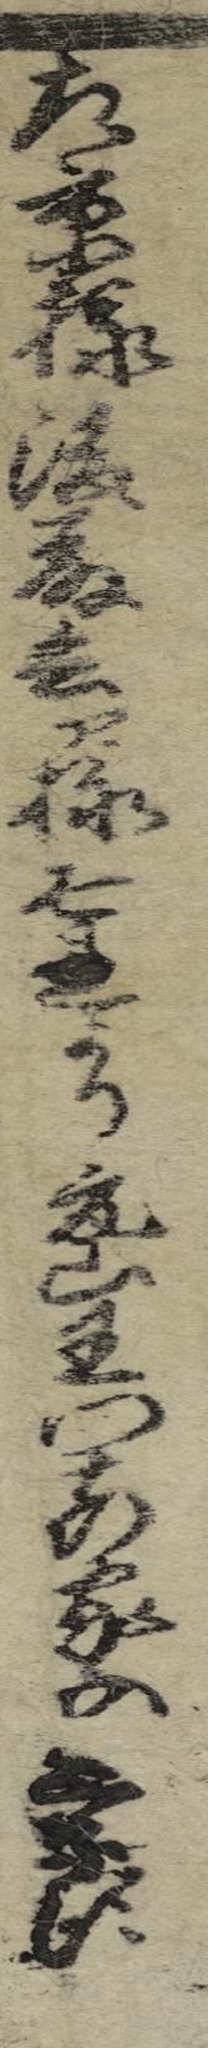左京様後藤兵部様それより元山王門前家のこらす
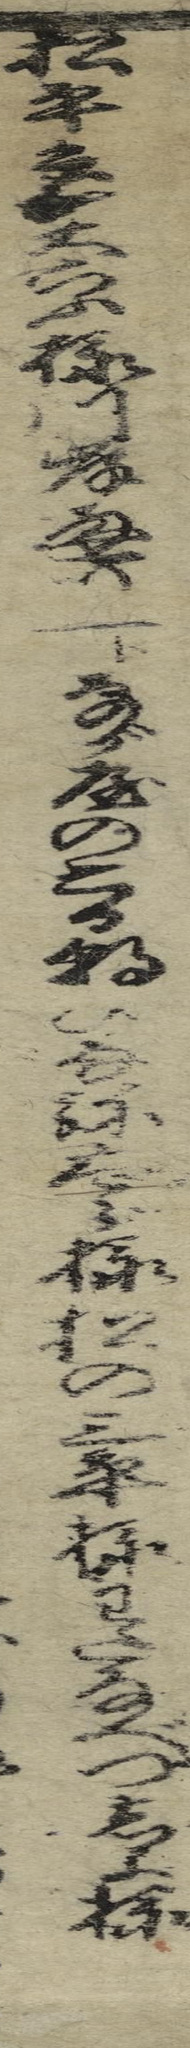松平兵部大いふ様川岸両方一トなが屋のこる朝ひな弥郎様松の三平様わたなべつしま様
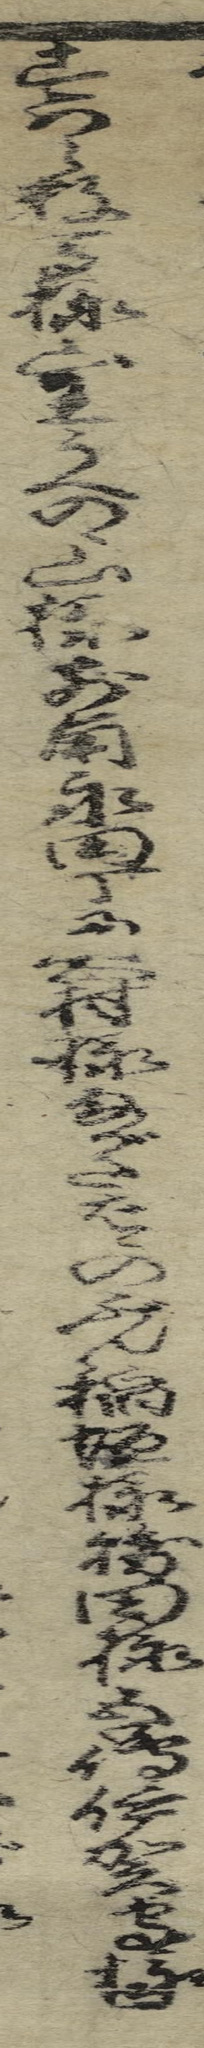すはら数馬様山うへの山様前南永田丁奥村様ながたばゝのぶん稲垣様勝田様五嶋伊賀守様
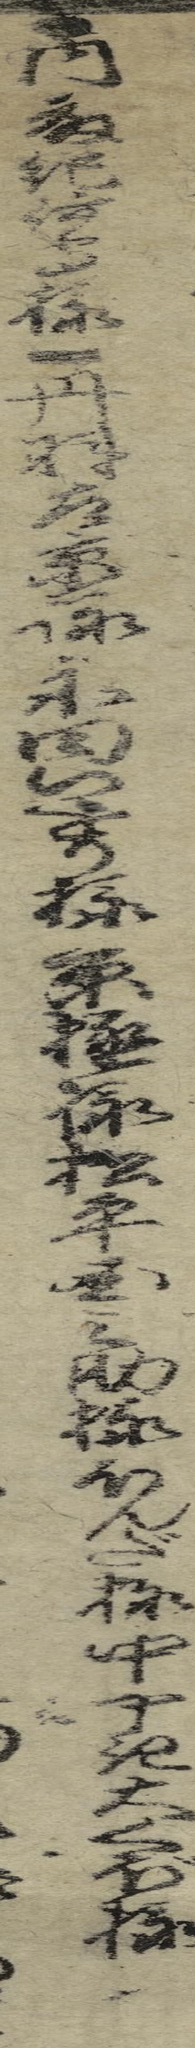●内藤紀伊守様丹羽左京様永田いをり様京極様松平国三郎様ほんだ様中やしき大くぼ様
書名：[嘉永三年二月の江戸大火に関する瓦版]
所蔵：東京大学地震研究所図書室 Earthquake Research Institute Library, The University of Tokyo, JAPAN
